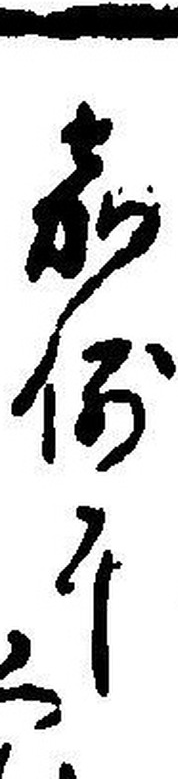嘉例に
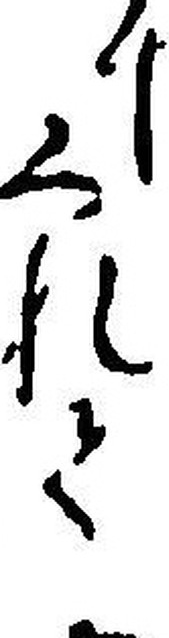くれて
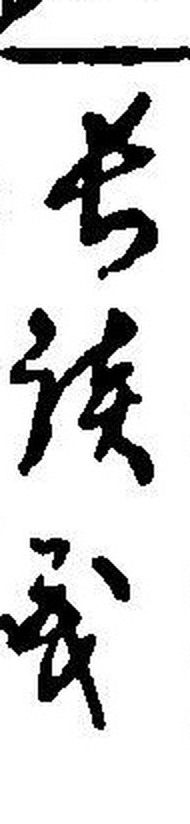長談義
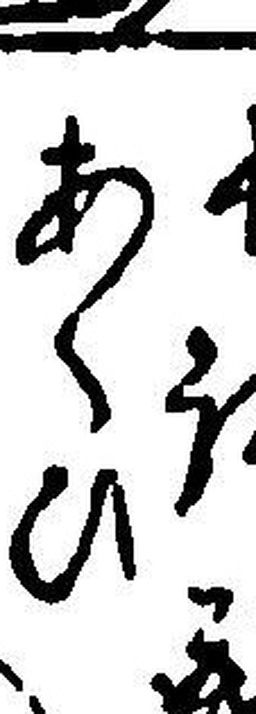あくひ
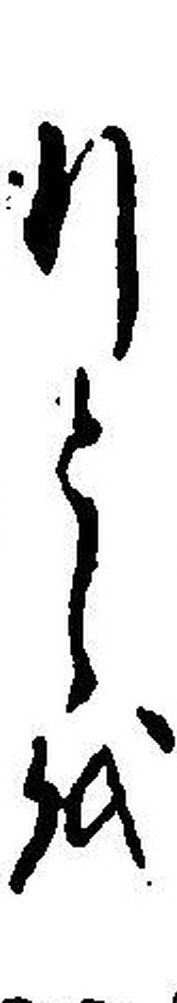行としを
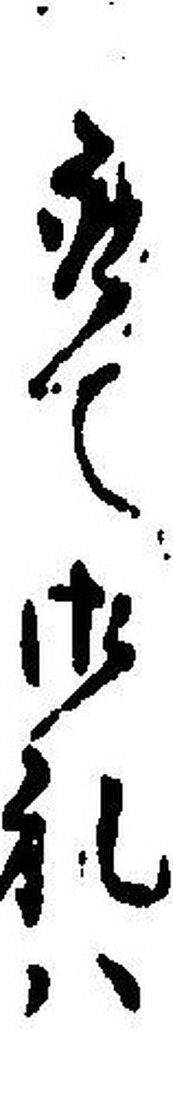取て御礼は
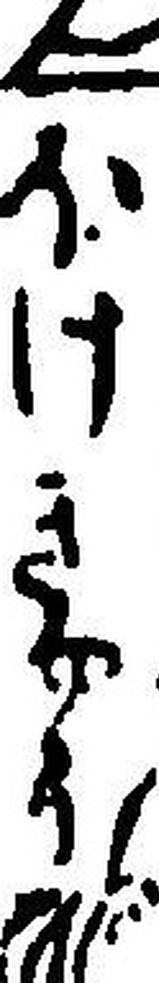ほけきやう
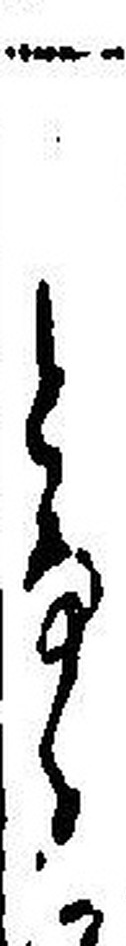となく
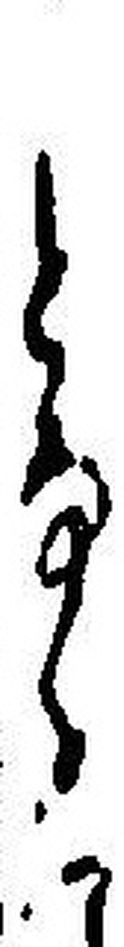となく
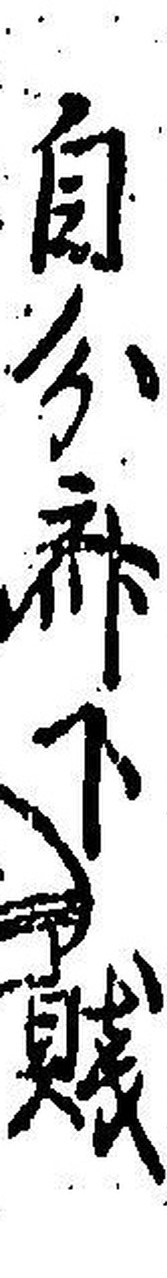自分斎下賤
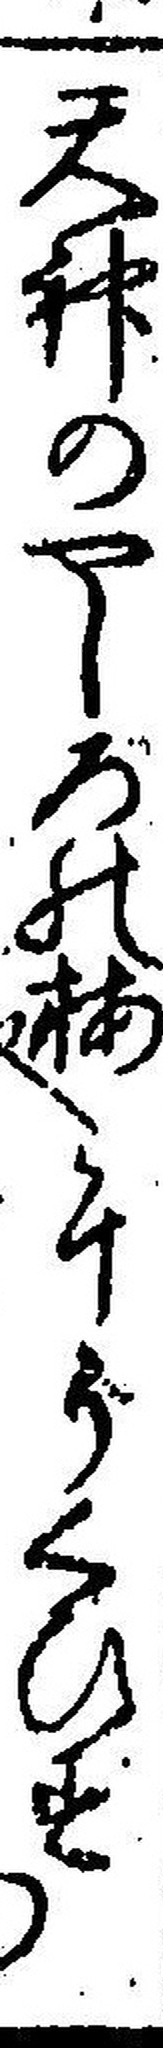天神のやしろの梅にうくひすの
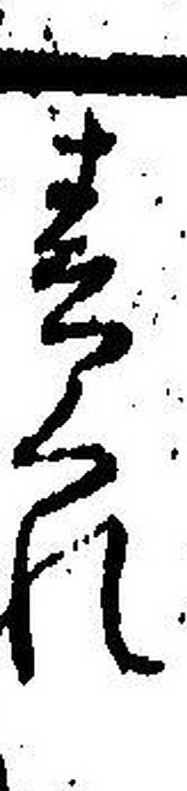春くれ
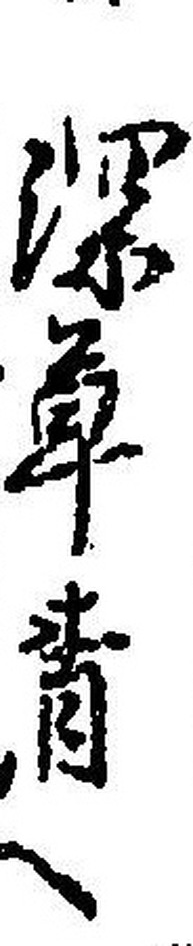深草青人
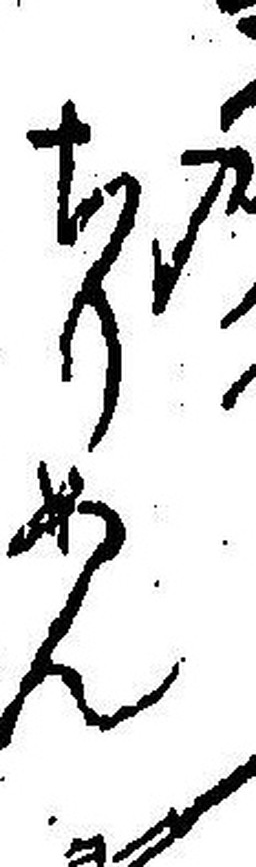ちりめん
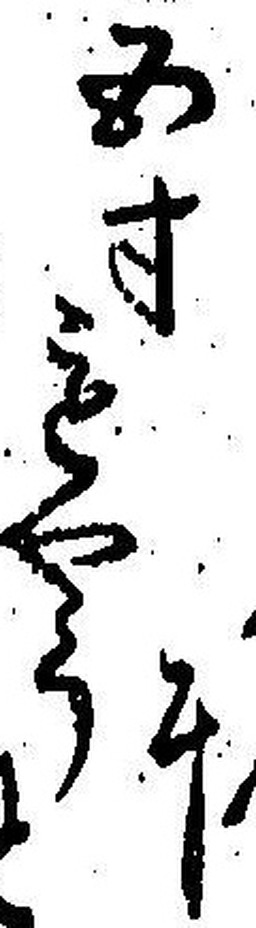みやうと
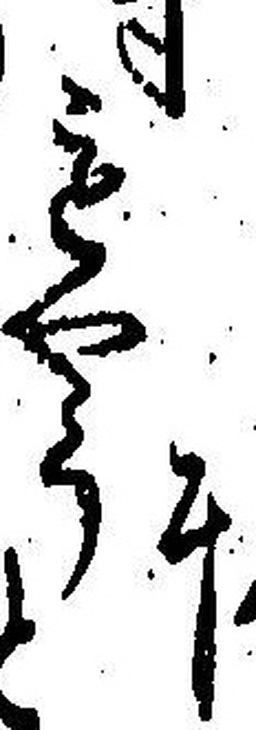みやうと
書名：どうれ百人一首 / 鹿都部真顔(狂歌堂)編
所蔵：東京大学総合図書館 General Library in the University of Tokyo, JAPAN
